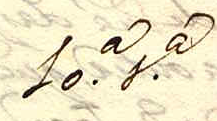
10.a t.a
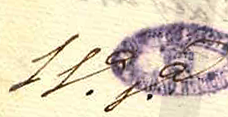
11.a t.a
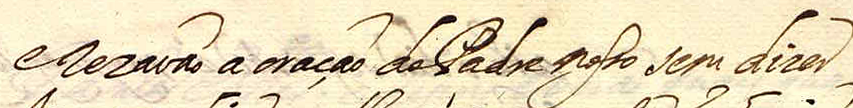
e Rezavaõ a oraçaõ do Padre nosso sem dizer
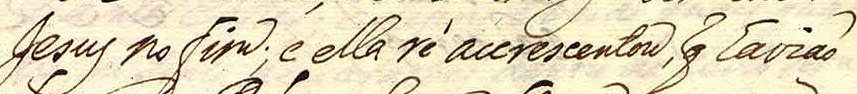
Jesus no fim; e ella ré accrescentou, q̄ haviaõ
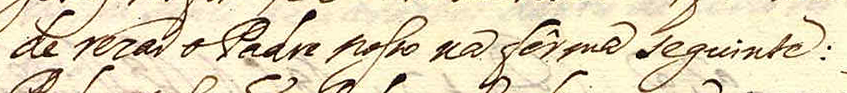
de rezar o Padre nosso na fôrma seguinte:
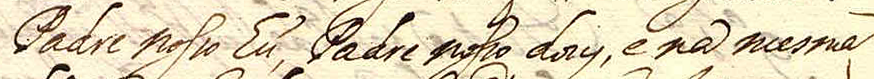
Padre nosso hū, Padre nosso dous, e na mesma
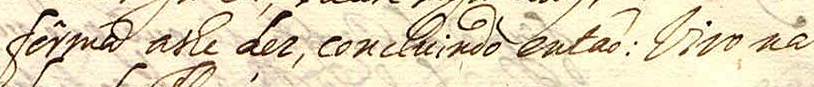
fôrma athe dez, concluindo entaõ: Vivo na
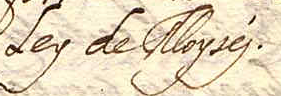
Ley de Moysés.
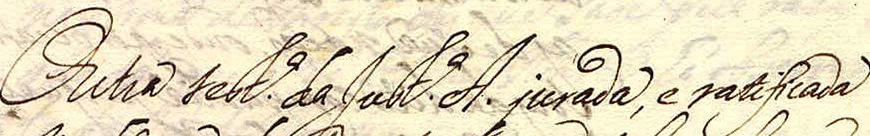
Outra test.a da Justa. A. jurada, e ratificada
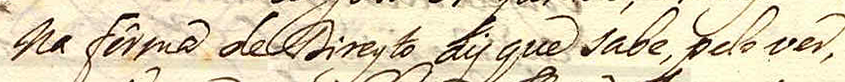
na fôrma de Direyto dis que sabe, pelo ver,
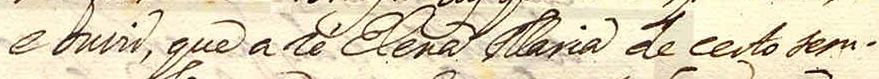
e ouvir, que a ré Elena Maria de certo tem-
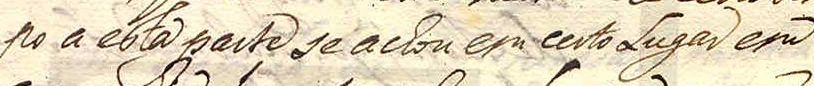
po a esta parte se achou em certo Lugar em
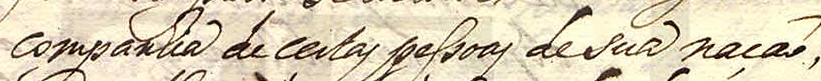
companhia de certas pessoas de sua naçaõ,
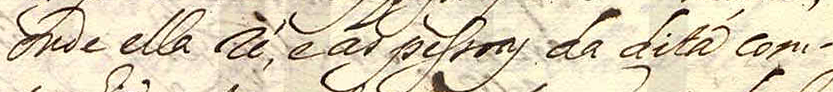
onde ella Ré, e as pessoas da dita com-
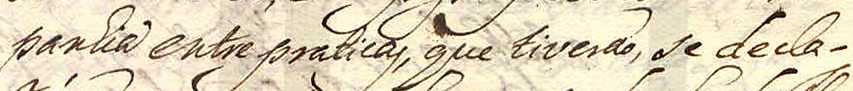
panhia entre praticas, que tiveraõ, se decla-
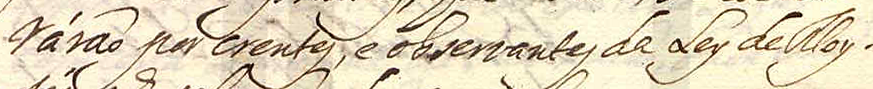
ráraõ por crentes, e observantes da Ley de Moy-
